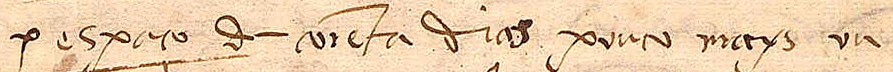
pessoas de cōreta dias pouco mays ou
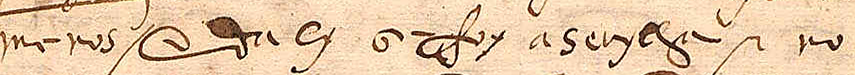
menos / e daly se foy a seuylha e no
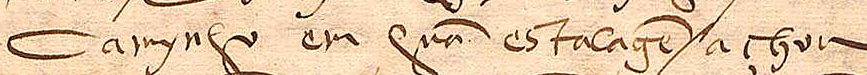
Camynho em hūa estalagē / achou
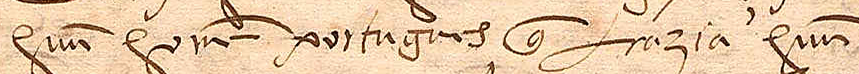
hūu homē portugues q̄ trazia hūu
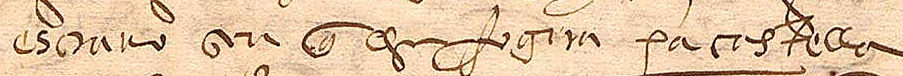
escrauo seu q̄ lhe fogira ꝑa castella
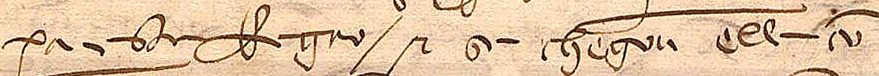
ꝑa este Regno / e se chegou elle cō
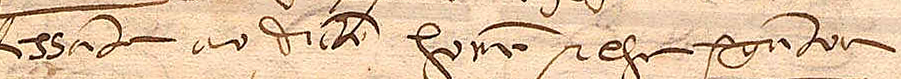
fessāte ao dic̄to homē e lhe ꝑgūtou
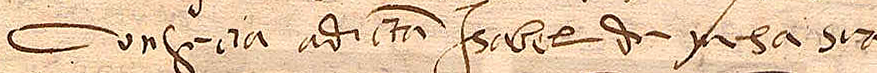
Conhecia a dic̄ta Jsabel de mesa sua
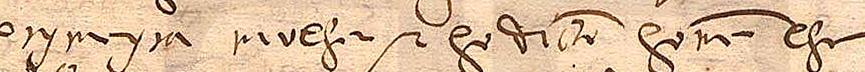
prymeyra molher e ho dīcto homē lhe
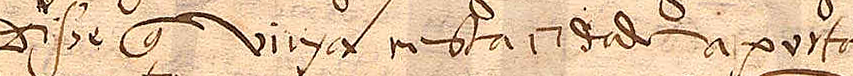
disse q̄ viuya nesta cidade a porta
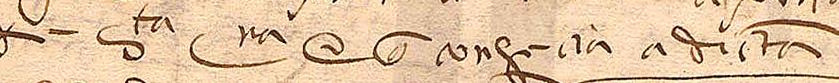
de Sta Cna e q̄ conhecia a dīcta
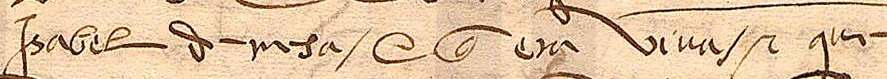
Jsabel de mesa / e q̄ era viua / e que
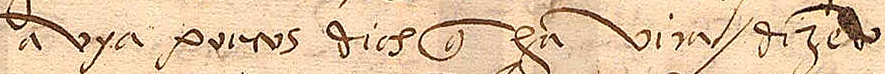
avya poucos dias q̄ ha vira / dizēdo
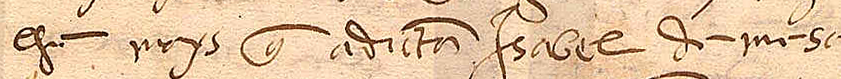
lhe mays q̄ a dic̄ta Jsabel de mesa
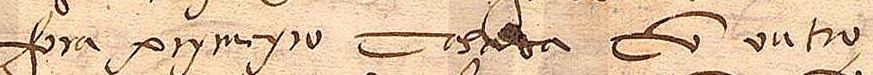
fora prymeyro casada cō outro
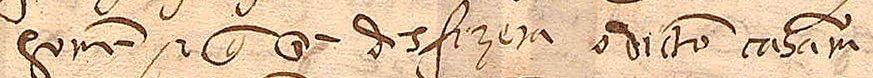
homē e q̄ se desfizera o dic̄to casamto
